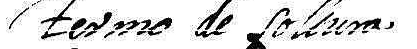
termo de soltura
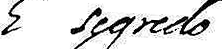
E segredo
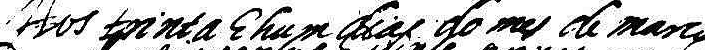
Aos trinta e hum dias do mes de marco
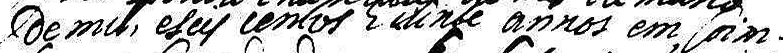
de mil, e seis centos e vinte annos em Coim
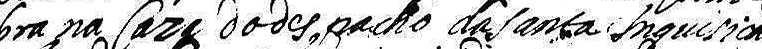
bra na Caza do despacho da Santa Inquisiçaõ
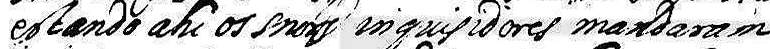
estando ahi os S.nor̄s inquisidores mandaram
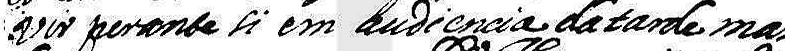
vir perante si em audiencia da tarde man
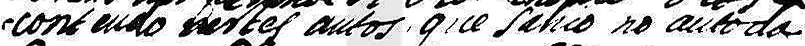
conteudo nestes autos que sahio no auto da
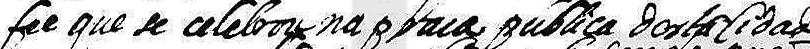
fee que se celebrou na praça publica desta Cidade
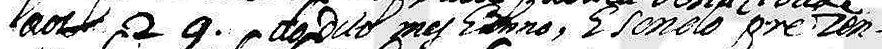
aos 29. do dito mes e anno, e sendo prezen
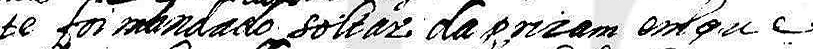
te foi mandado soltar da prizam em que
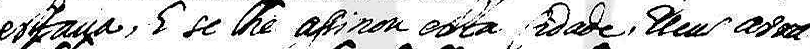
estaua, e se lhe assinou esta Cidade, e seus arra
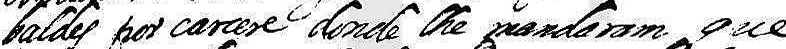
baldes por carcere donde lhe mandaram que
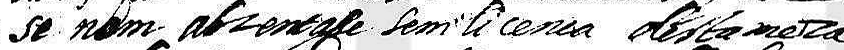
se nam abzentase sem licenca desta meza
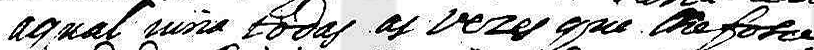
a qual uiria todas as vezes que lhe fosse
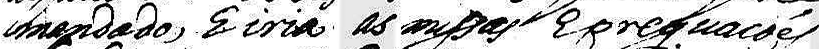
mandado, e iria as missas e preguaçoẽs
